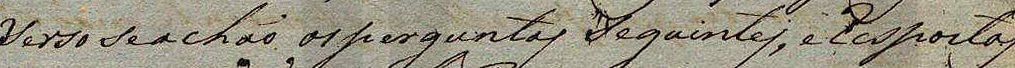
verso se achaõ as perguntas seguintes, e respostas
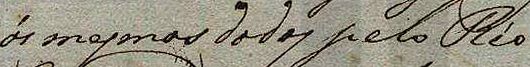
ás mesmas dadas pelo Réo.
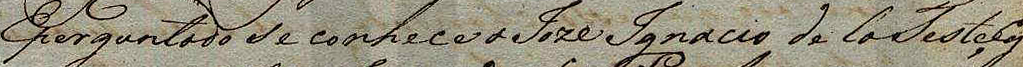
E perguntado se conhece Joze Ignacio de la Teste cy
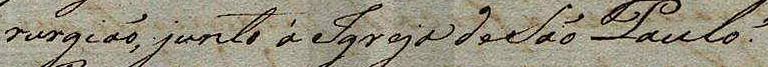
rurgiaõ, junto á Igreja de Saõ Paulo?
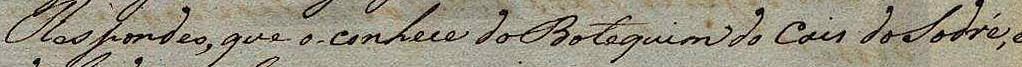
Respondeo, que o conhece do Botequim do Cais do Sodré, e
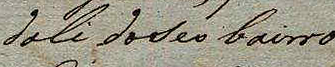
dali do seu bairro.
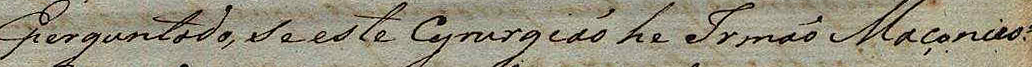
Perguntado, se este cyrurgiaõ he Irmaõ Maçonico?
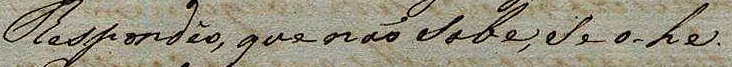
Respondêo, que naõ sabe, se o he.
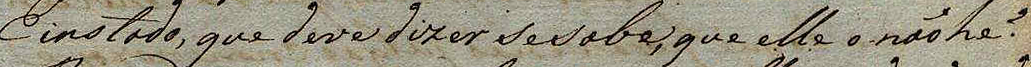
E instado, que deve dizer se sabe, que elle o naõ he?
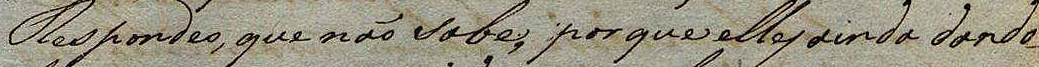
Respondeo, que naõ sabe, por que elles ainda dando
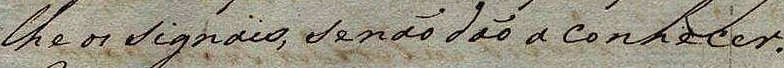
lhe os signais, se não daõ a conhecer.
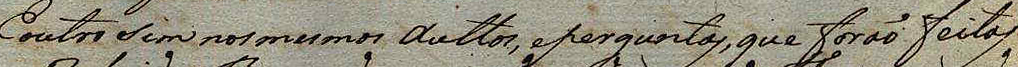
E outro sim nos mesmos Auttos, e perguntas, que foraõ feitas
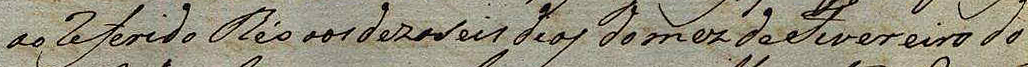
ao referido Réo aos dezaseis dias do mez de Fevereiro do
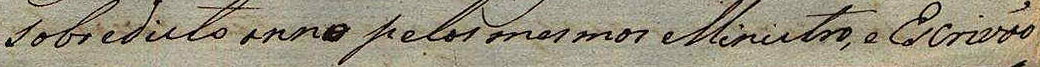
sobredicto anno pelos mesmos Ministro, e Escrivaõ
